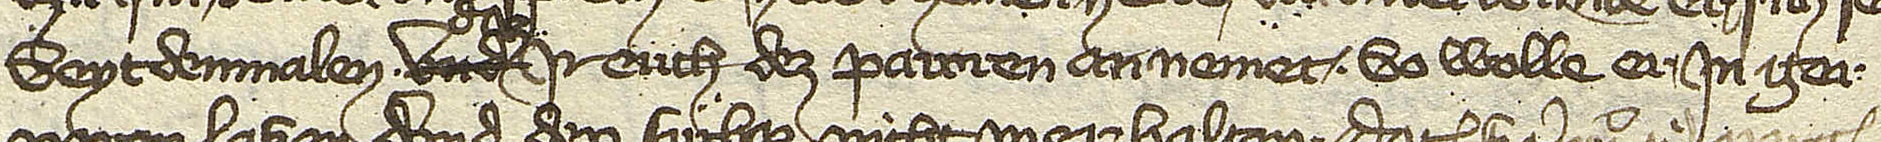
Seytdenmalen. Vnd Ir euch deʒ pawren annemet / . So wolle ew In ger
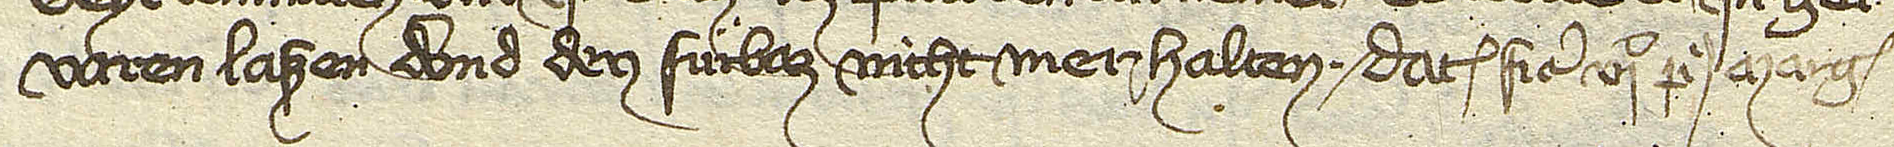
varen laſʒen vnd den fürbaʒ nicht mer halten . / dat* fia* vi* p* Marg*
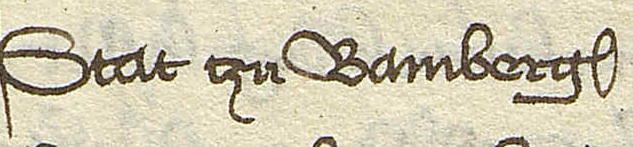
Stat cʒu Bamberg*
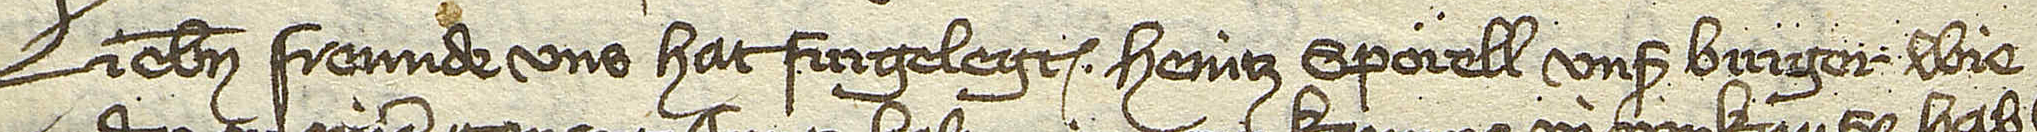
Liebn* freunde vns hat furgelegt / heincʒ Spörell vnſ* burger wie
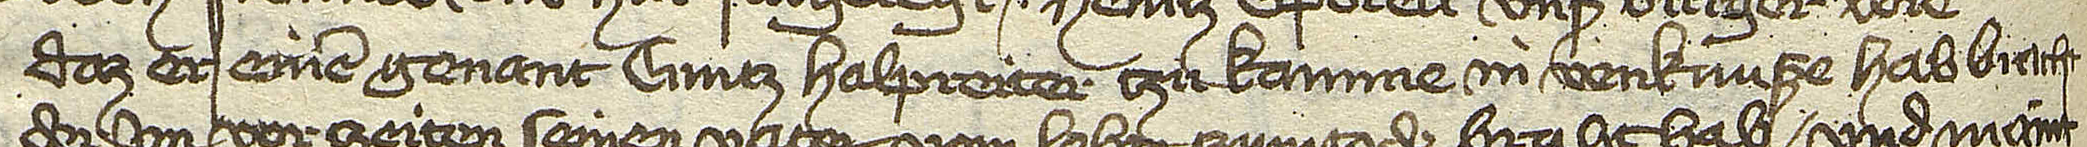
daʒ er eine* genant Cuncʒ halpreiter cʒu kamme in venknüſʒe hab bracht
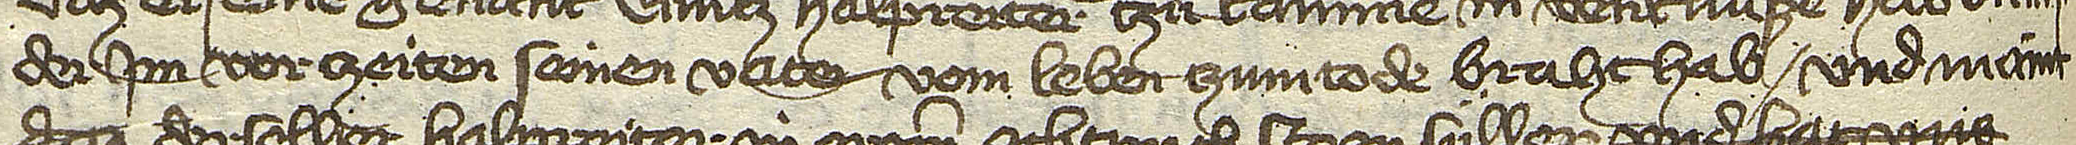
des Im vor cʒeiten ſeinen vater vom leben cʒum tode braht hab / vnd maint
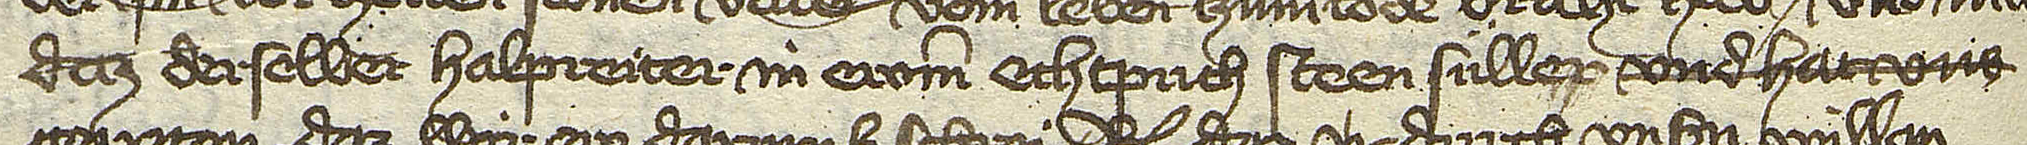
daʒ derſelber halpreiter in ewm* echtpuch ſteen ſüllet vnd hat vns
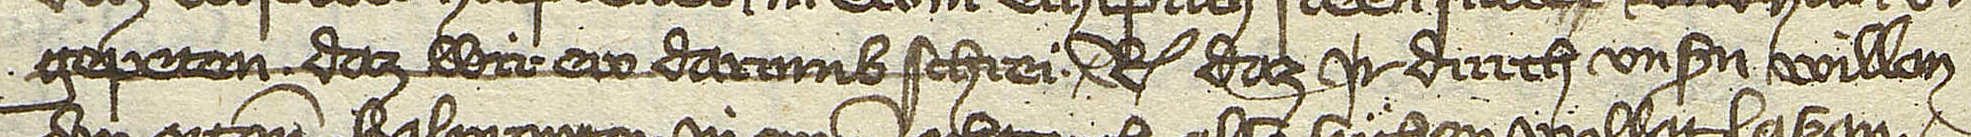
gepeten . daʒ wir ew darumb ſchrei / R* daʒ Ir durch vnſ*n willen
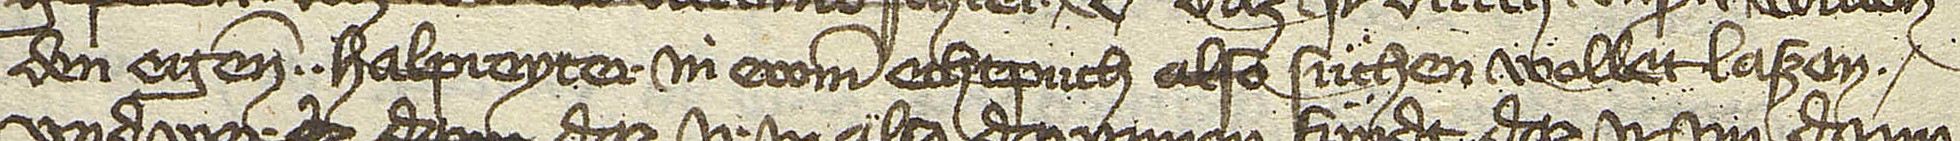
den egen* ~ halpreyter in ewm* echtpuch alſo ſüchen wollet laſʒen . /
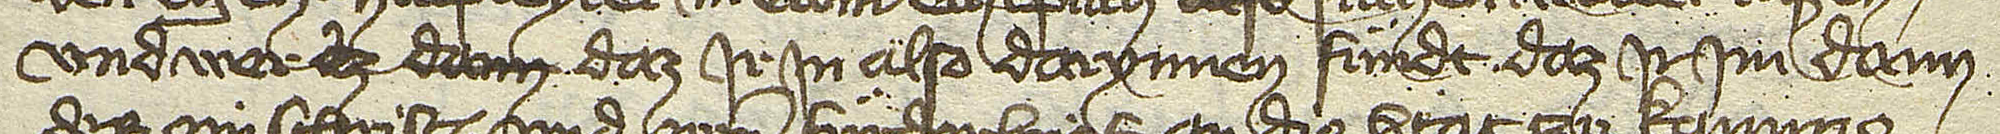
vnd wer eʒ dann daʒ Ir In alſo darynnen fündt daʒ Ir Im dann
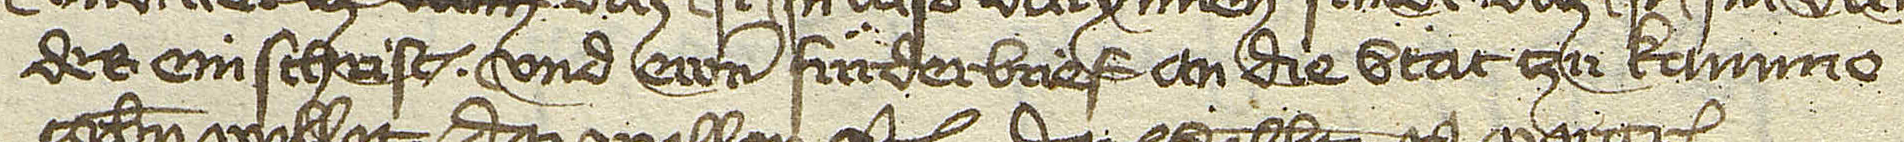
des ein ſchriſt / . vnd ewn* fürderbrief an die Stat cʒu Kamme
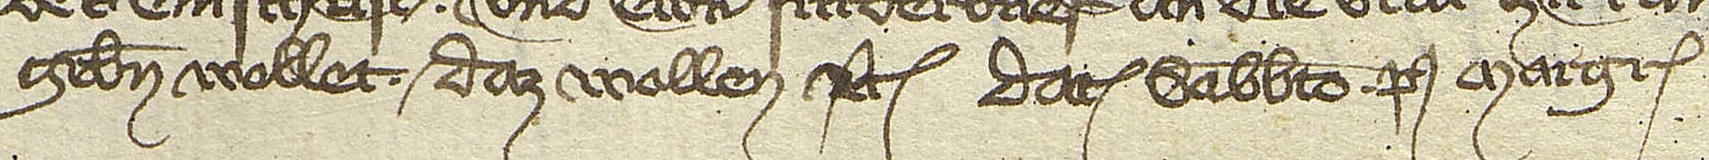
gebn* wellet . / daʒ wollen ec* dat* Sabbo* p* Margr*
